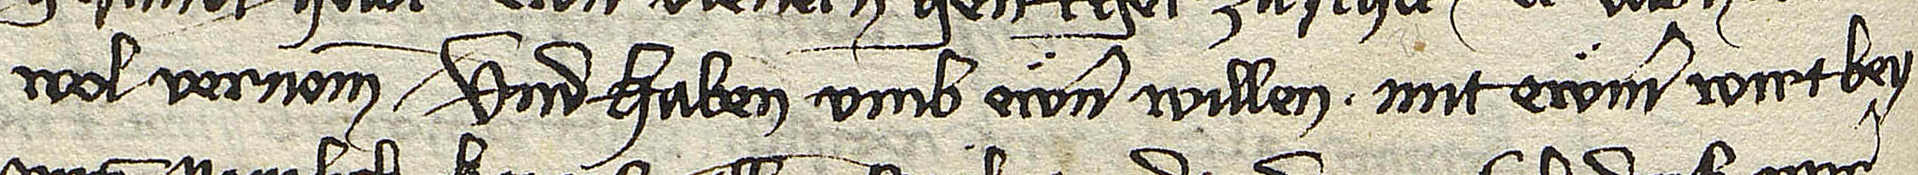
wol vernom* / Vnd haben eẅn* willen . mit eẅm* wirt bey
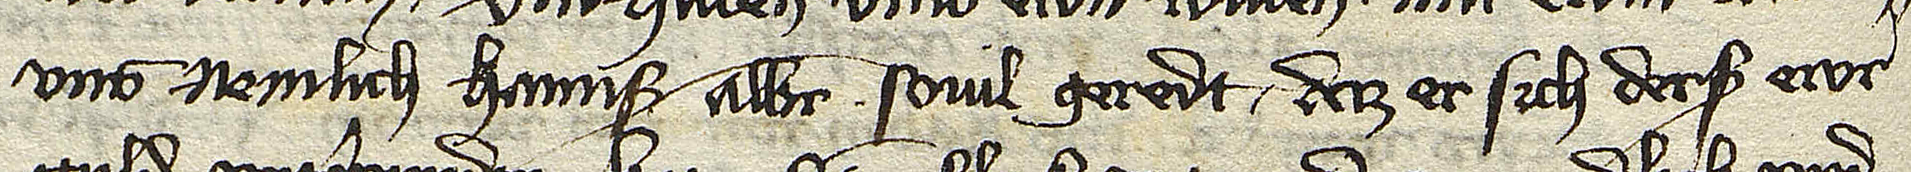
vns nemlich hannſ* albr* . ſouil geredt / daʒ er ſich derſ* ewr*
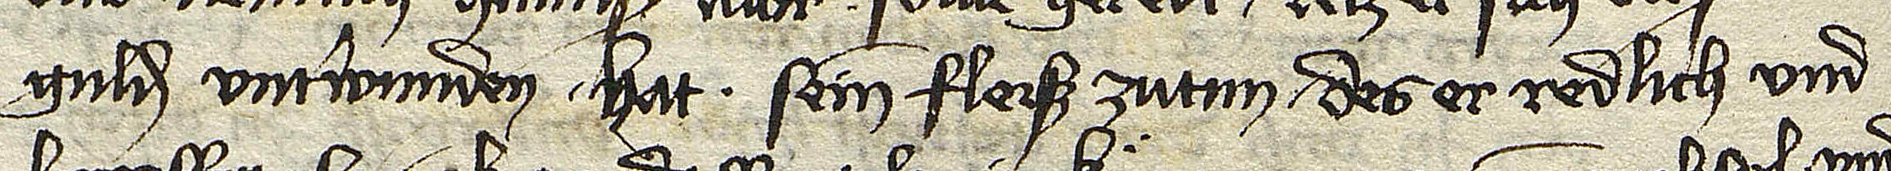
guld* vnt*wunden hat . ſein* fleiſʒ ʒutun / des er redlich vnd
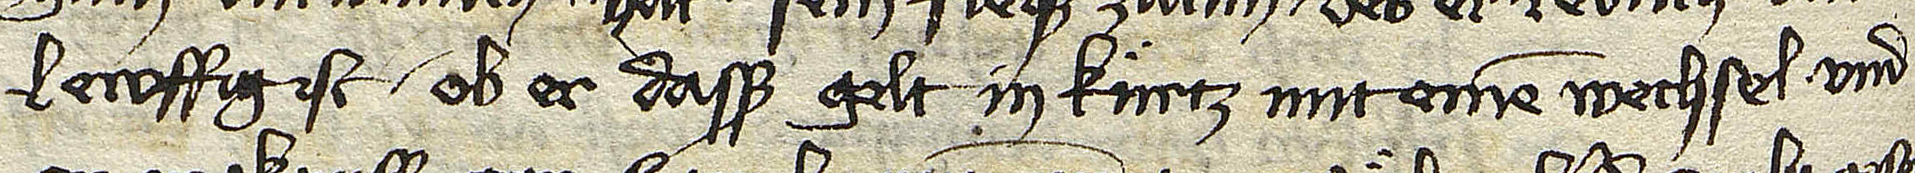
lewffig iſt / ob er daſſ* gelt in kürcʒ mit eine* wechſel . vnd
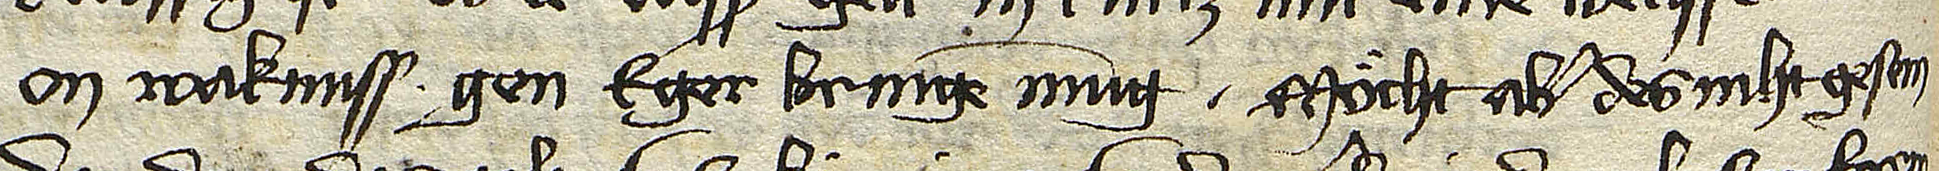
on waknuſſ . gen Eger bringe* mug / Möcht ab* des niht* geſein
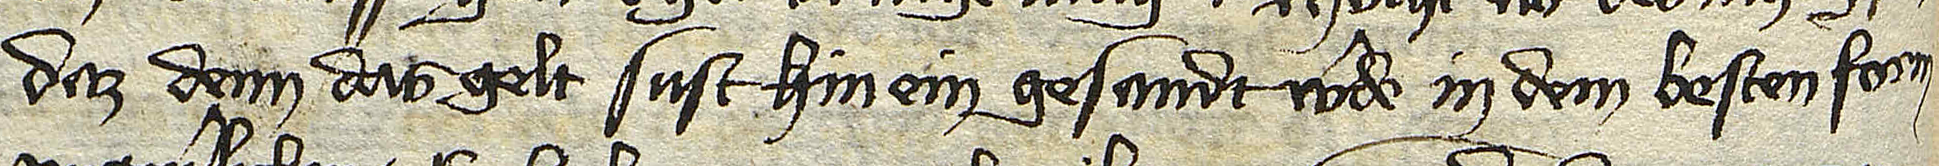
daʒ denn das gelt ſuſt hinein geſandt w*de in dem beſten form
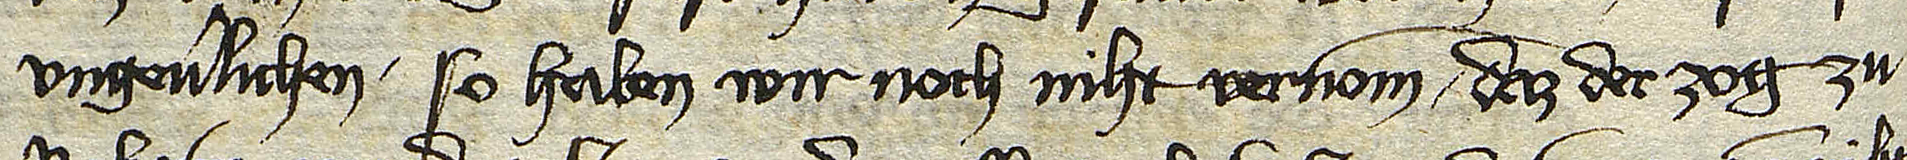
vngeu*lichen / ſo haben wir noch niht vernom* / daʒ der ʒog ʒu
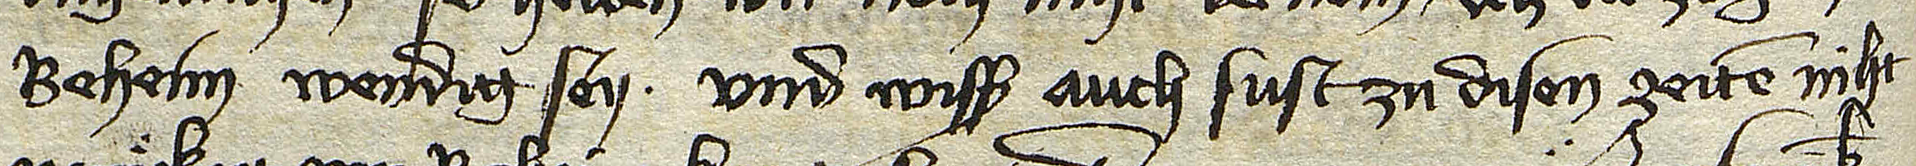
Beheim wendig ſey . vnd wiſſ* auch ſuſt ʒu diſen ʒeite* niht
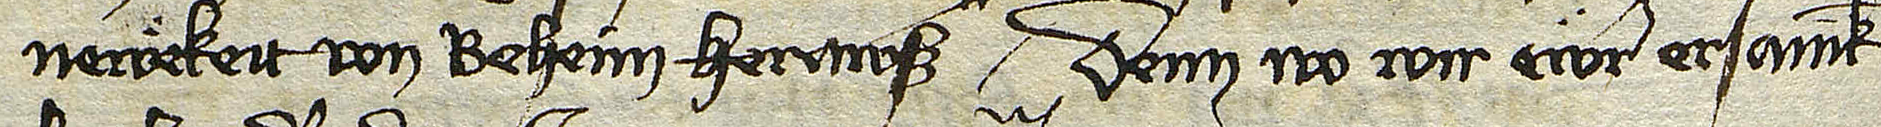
neẅekeit von Beheim herawſʒ / Denn wo wir eẅr* erſamk*
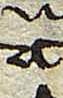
ec*
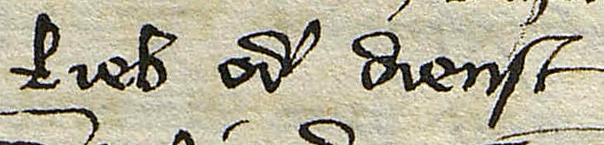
lieb od* dienſt
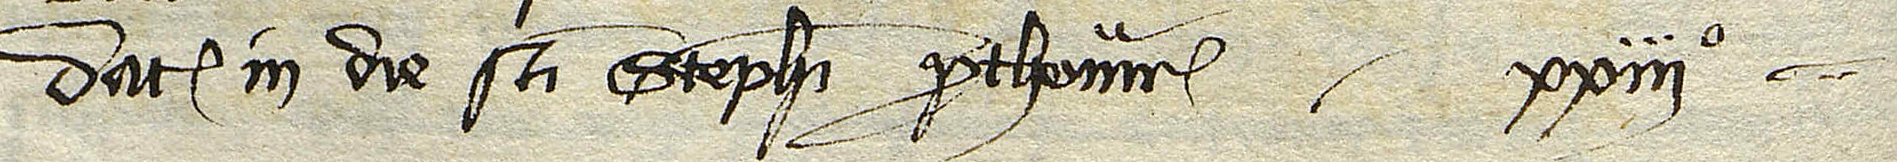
Dat* in die ſc*i Stephi* p*thomr* / xxiii*
